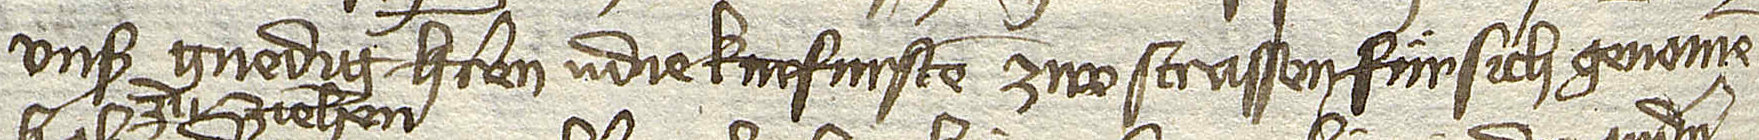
vnſ* gnedig h*ren ~ die kurfurſte* ʒwo ſtraſſen für ſich genome*
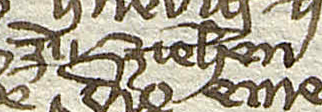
ʒu ʒiehen
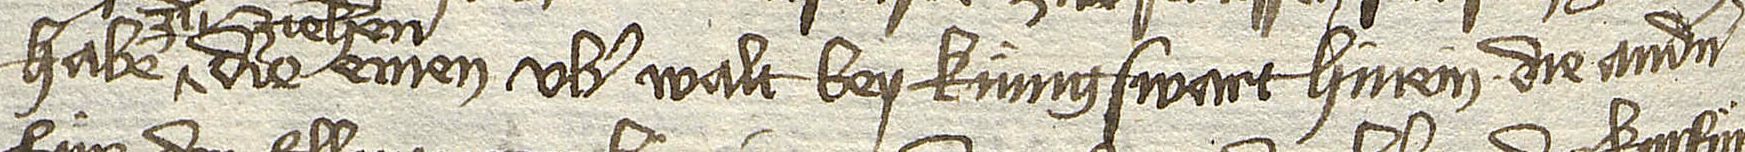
habe* die einen vb* walt bey künigſwart hinein . die and*n
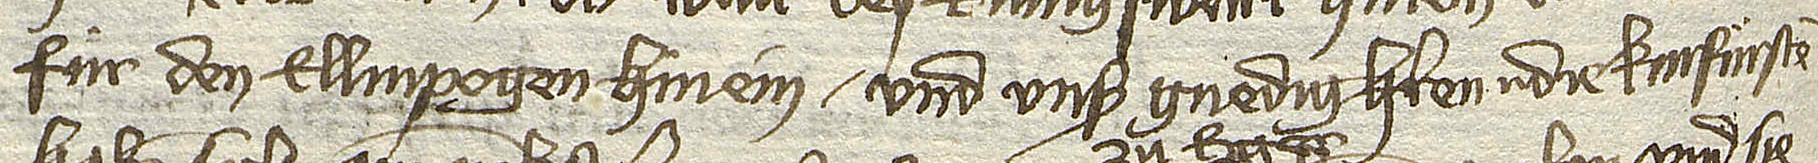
für den Ellmpogen hinein / vnd vnſ* gnedig h*ren ~ die kurfürſte*
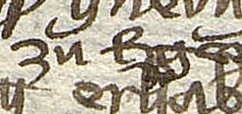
ʒu Eger
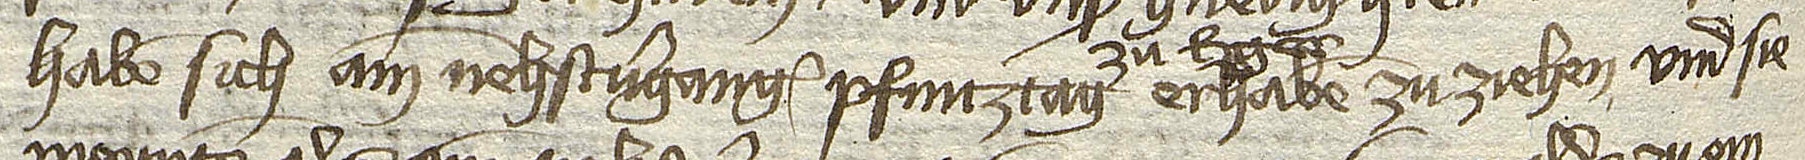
habe* ſich am* nehſtu*gang* pfinʒtag erhabe* ʒu ʒiehen vnd ſie
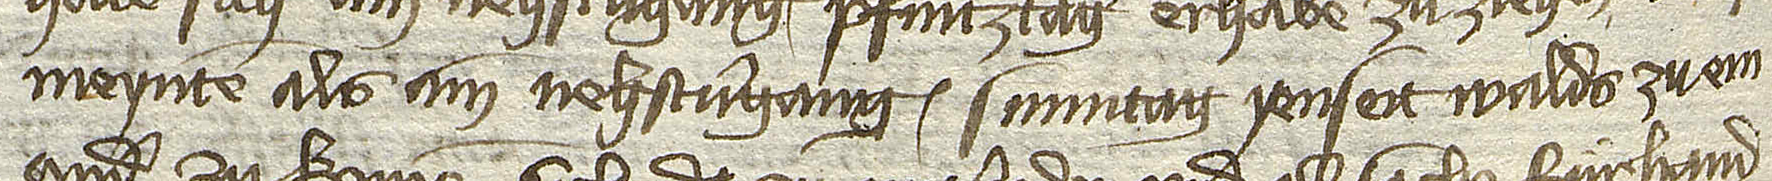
meynte* als am* nehſtu*gang* ſunntag yenſeit walds ʒu ein
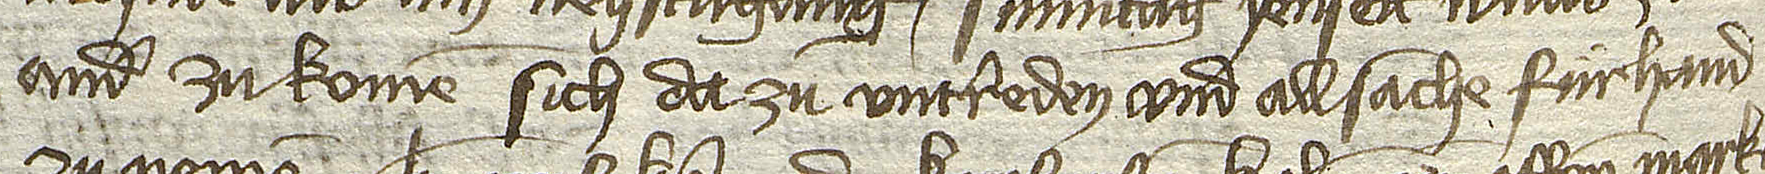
and* ʒu kome* ſich da ʒu vntreden* vnd all ſache für hand
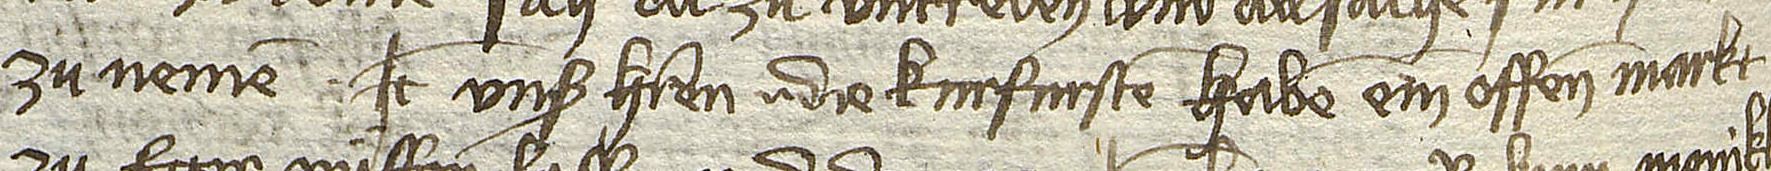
ʒu neme* It* vnſ* hren* ~ die kurfurſte* habe* ein* offen* markt
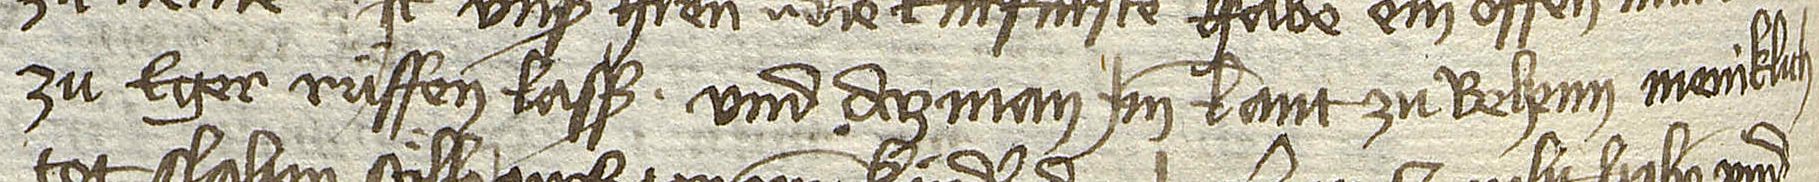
ʒu Eger rüffen laſſ* . vnd daʒ man Im lant ʒu Beheim meniklich
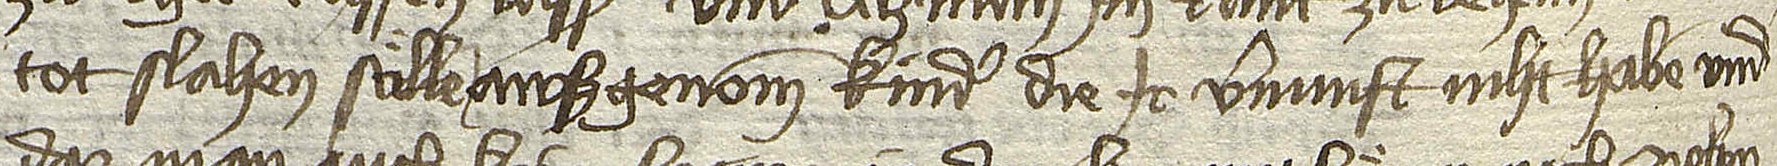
tot ſlahen ſülle awſʒ genom* kind* die Ir v*nunft niht habe* vnd
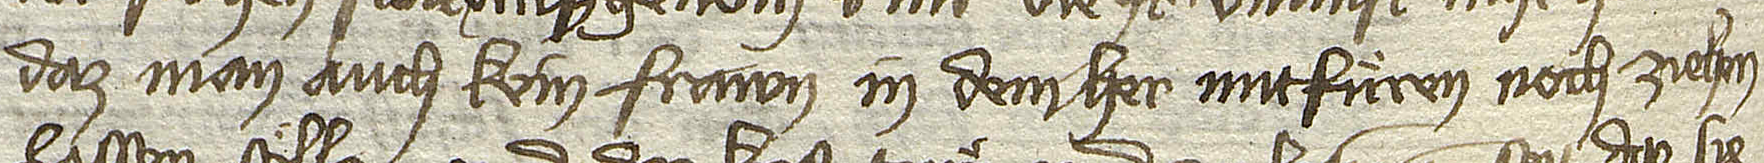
daʒ man auch kein frawn in dem her mitfüren noch ʒiehen
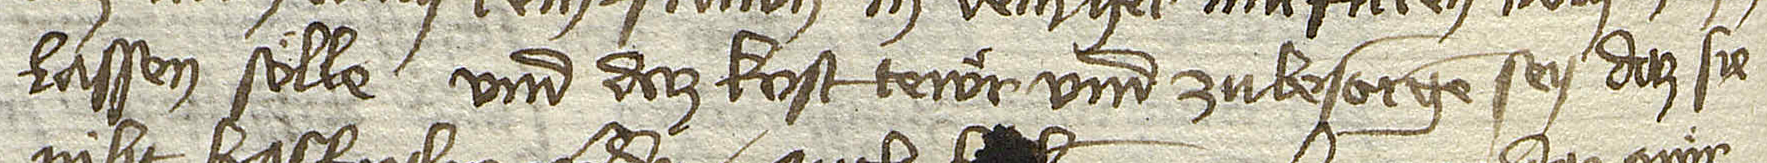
laſſen ſölle vnd daʒ koſt tewr vnd ʒubeſorge* ſey daʒ ſie
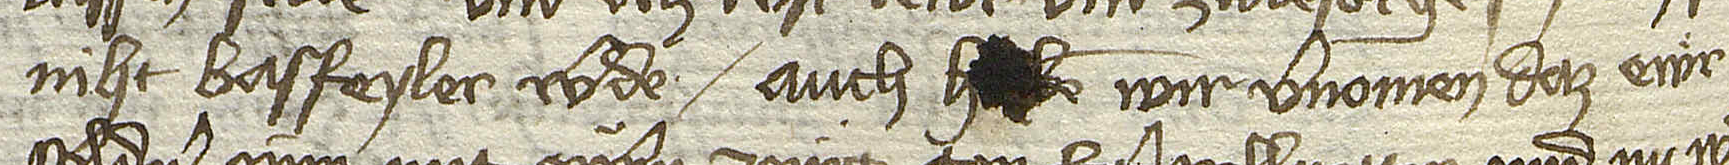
niht baſfeyler w*de . / auch h%be* wir v*nomen daʒ ewr
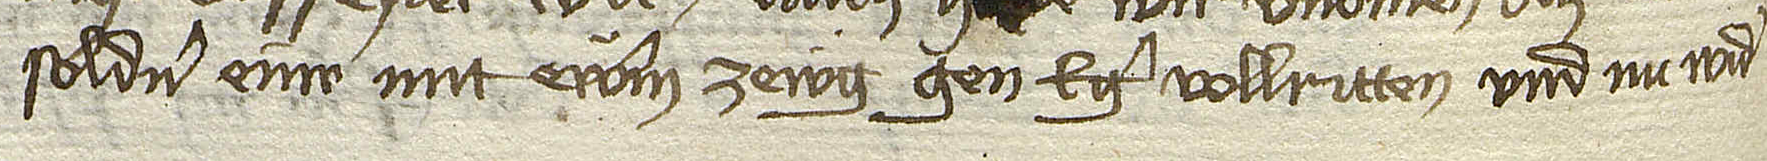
ſoldn* einr mit ew*m ʒewg gen Eg* vollritten vnd nu wid*
